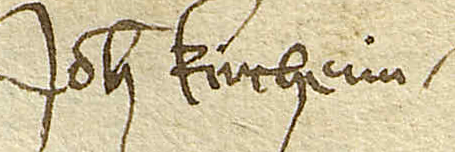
Ioh* Kircheim /
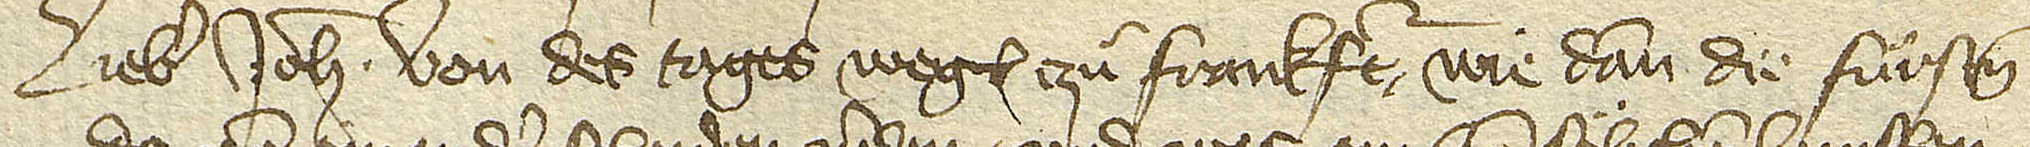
Lieb* Ioh*. Von des tages weg* cʒü frankf*t / wie dan* die fürſtn*
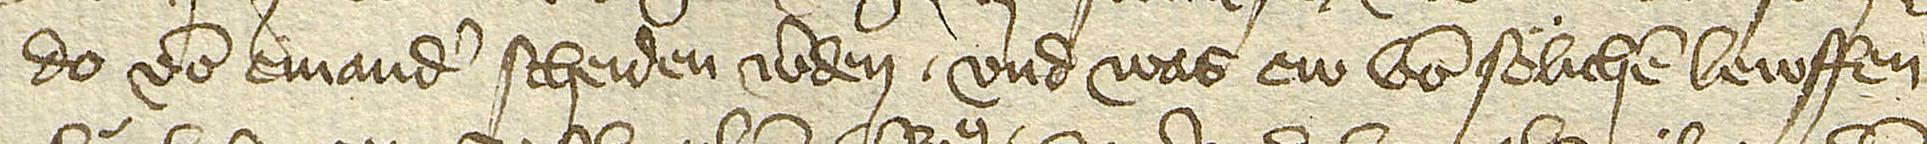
do vo* einand* ſcheiden w*den / vnd was ew vo* ſöliche* lewffen
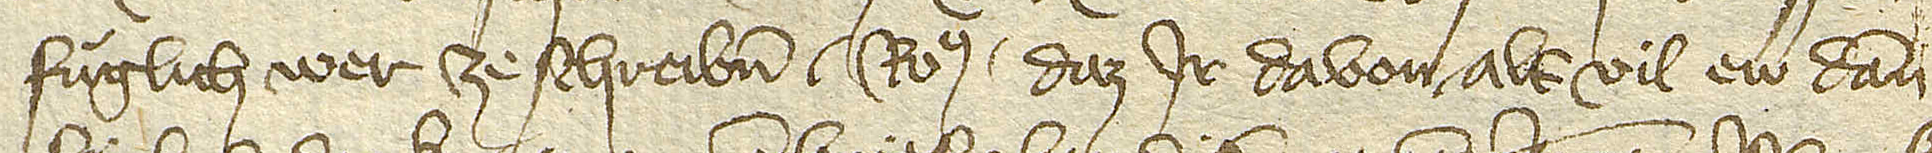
füglich wer cʒe ſchreibn* / Ro* / daʒ Ir davon / als vil ew dan*
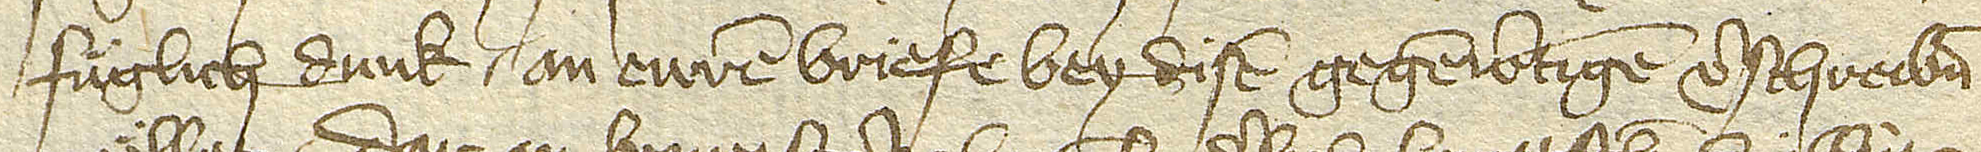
füglich dunk / an ewre* briefe bey diſe* gege*w*tige* v*ſchreibn*
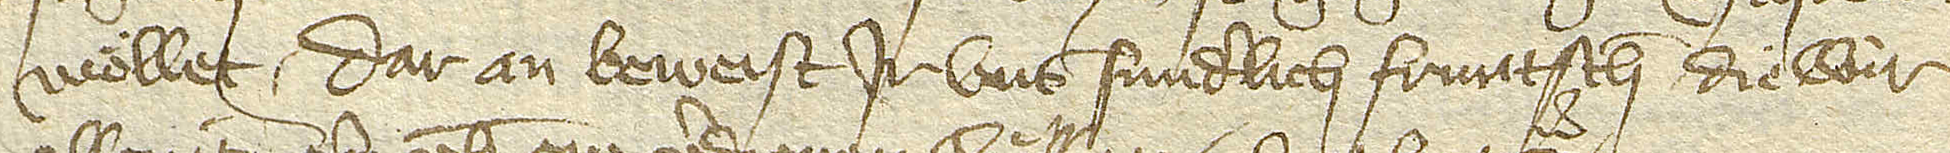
wöllet / Dar an beweiſt Ir vns ſund*lich fruntſch* die wir
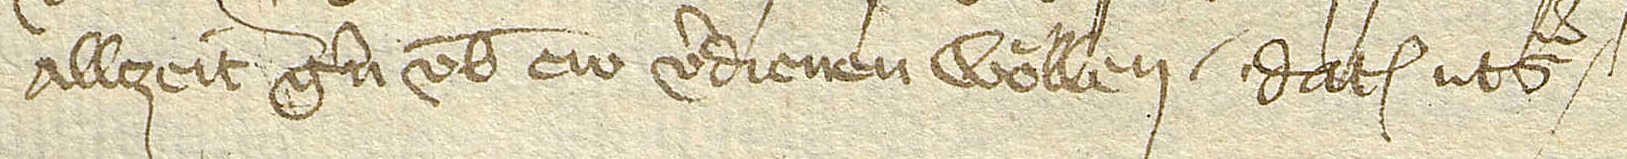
allcʒeit g*n vb* ew v*dienen wöllen / dat* uts* /
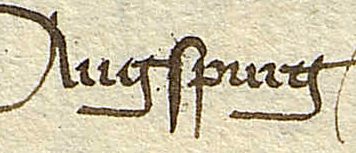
Augſpurg*
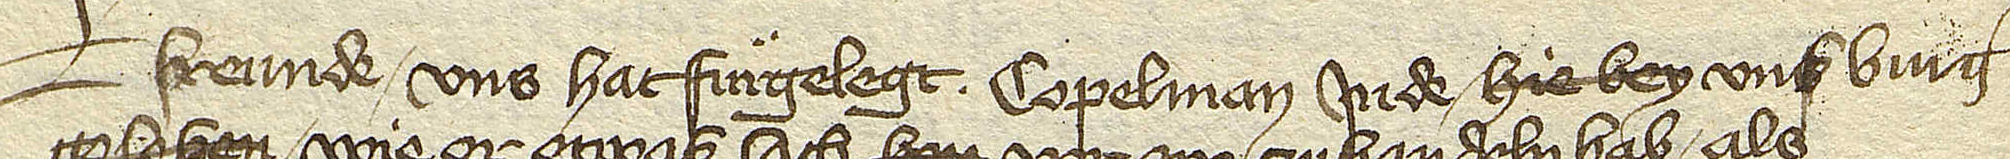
L* freunde / vns hat fürgelegt Copelman Iude / hie bey vnſ* burg*
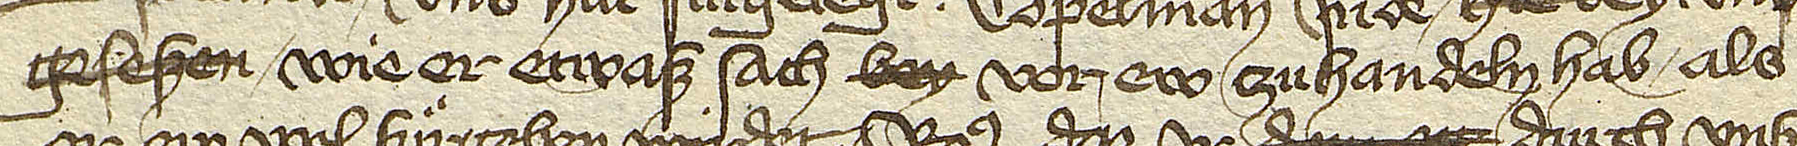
geſeſʒen / wie er etwaſʒ ſach bey vor ew cʒu handeln hab / als
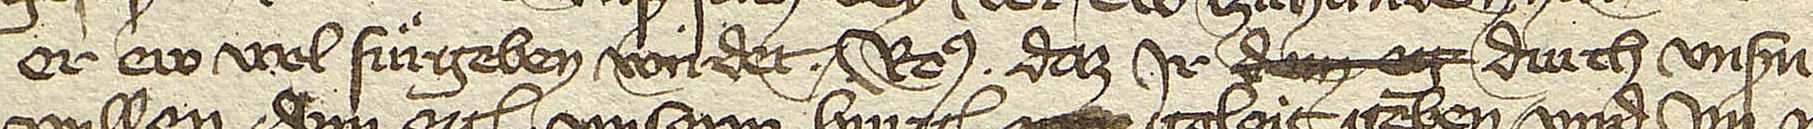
er ew wol fürgeben wirdet . / Ro* . daʒ Ir dan* eg* durch vnſ*n
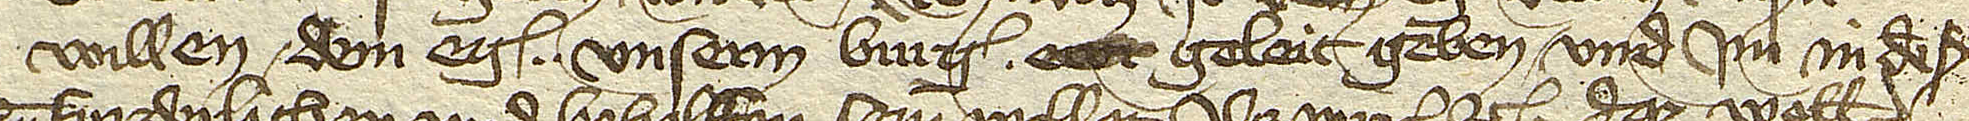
willen / dem eg* ~ vnſerm burg* . ewr geleit geben / vnd Im in de*ſ*
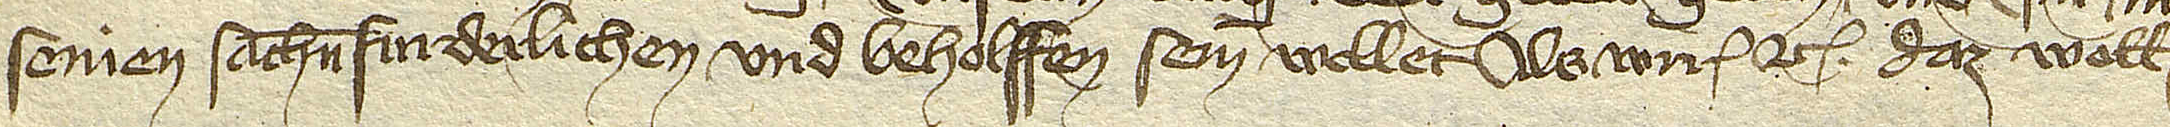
ſeinen ſachn* furderlichen vnd beholffen ſein wollet Als wir* ec* daʒ woll*
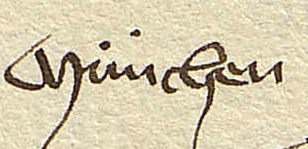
München
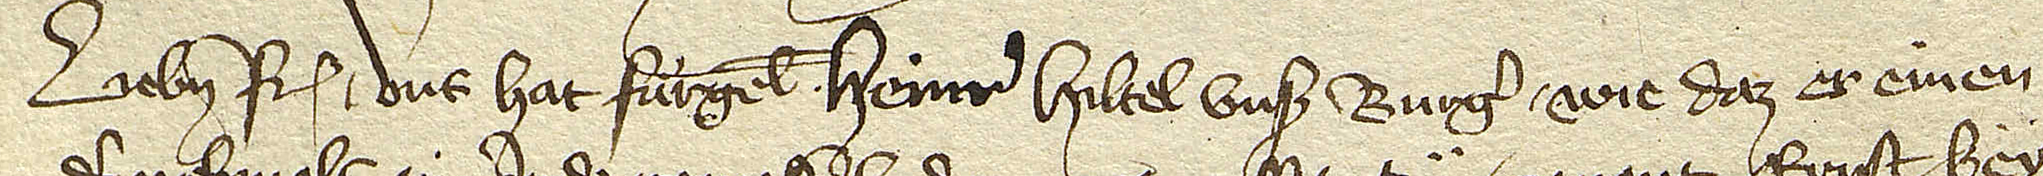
Liebn* fr* / Vns hat fürgel* heinr* hiltel vnſ* Burg* / wie daʒ er einen
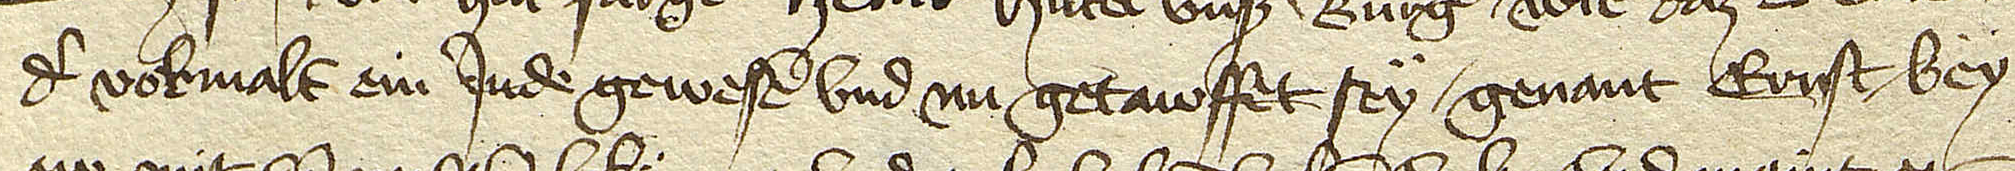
d* vormals ein Iude geweſe* vnd nu getawffet ſey / genant Ernſt / bey
